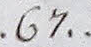67
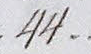44
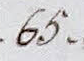65
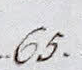65
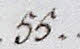55
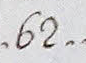62
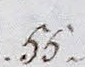55
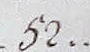52
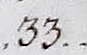33
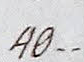40
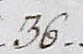36
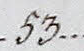53
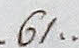61
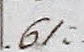61
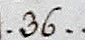36
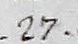27
